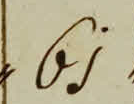61
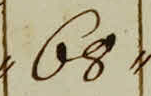68
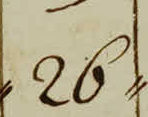26
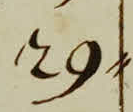29
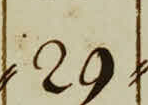29
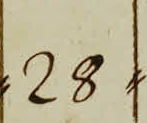28
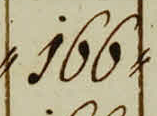166
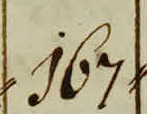167
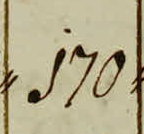170
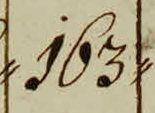163
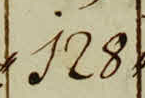128
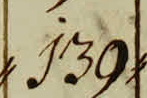139
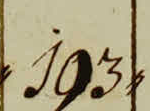193
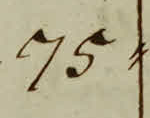75
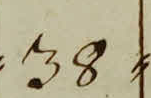38
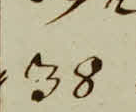38
